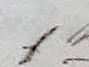1
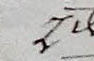2
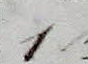1
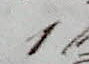1
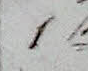1
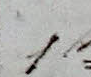1
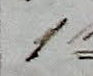1
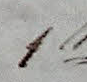1
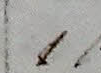1
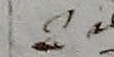2
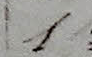1
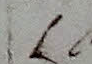1
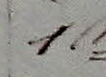1
